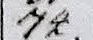74
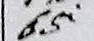65
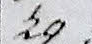29
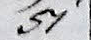57
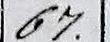67
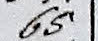65
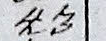43
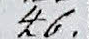46
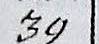39
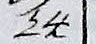24
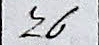26
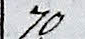70
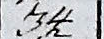34
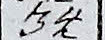34
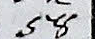58
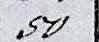50
